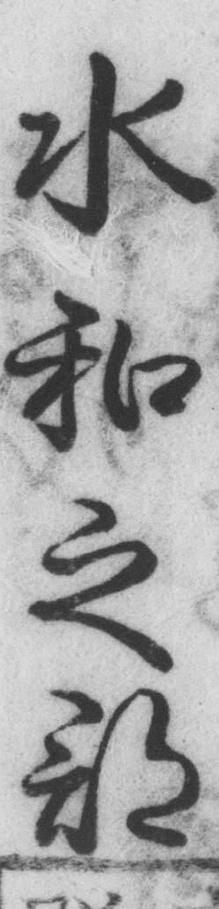水和之部
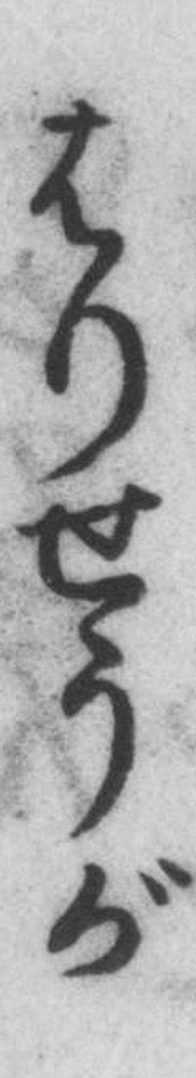はりせうが

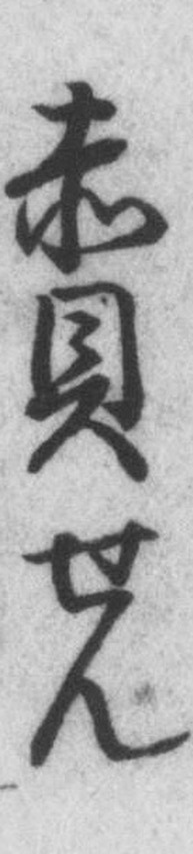赤貝せん

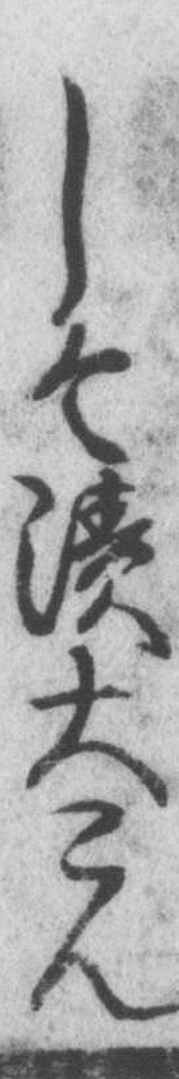しそ漬大こん

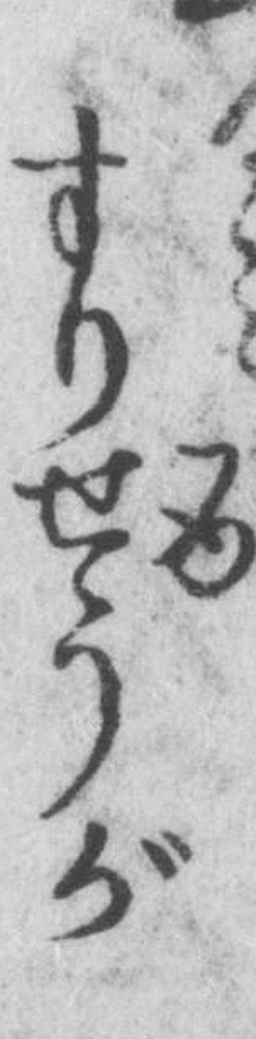すりせうが
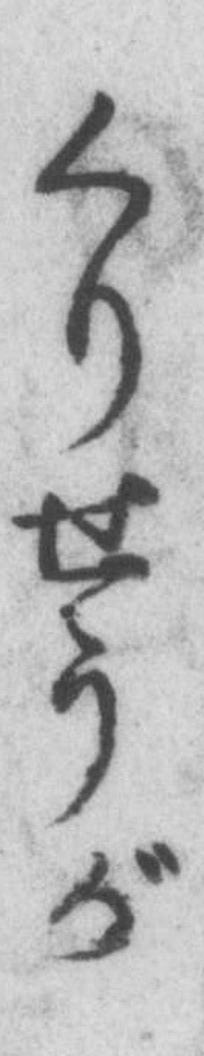すりせうが

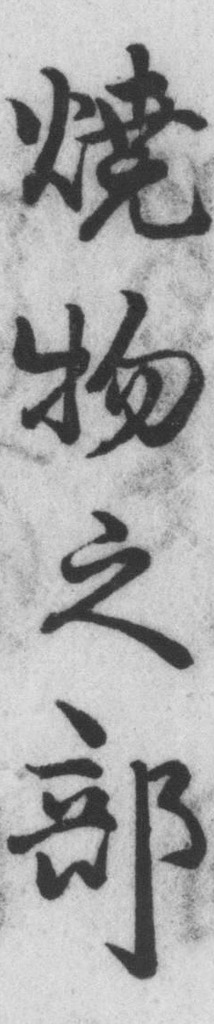焼物之部

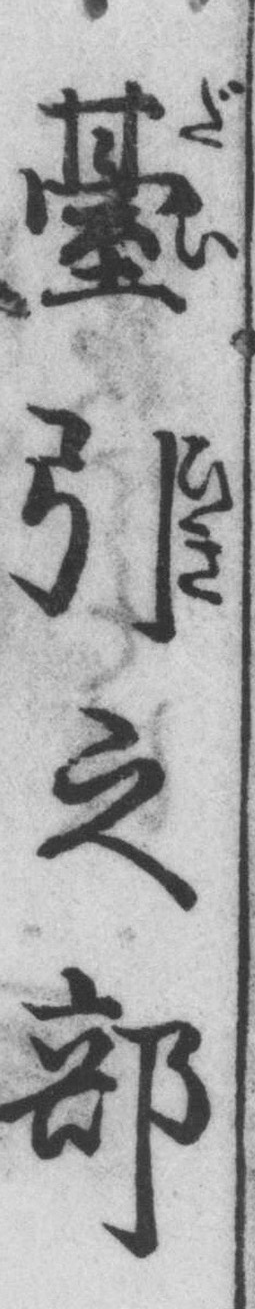臺引之部

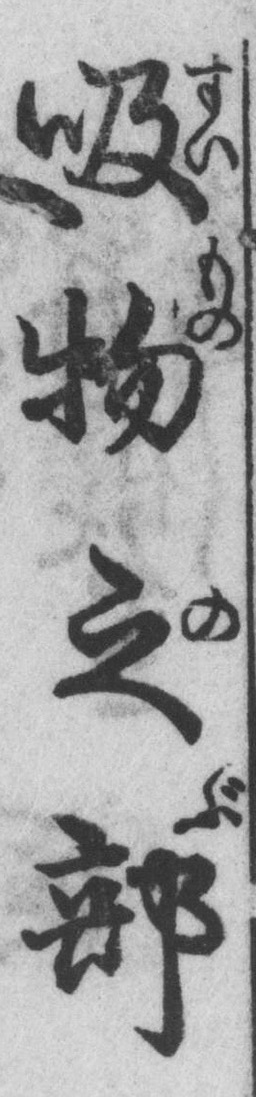吸物之部

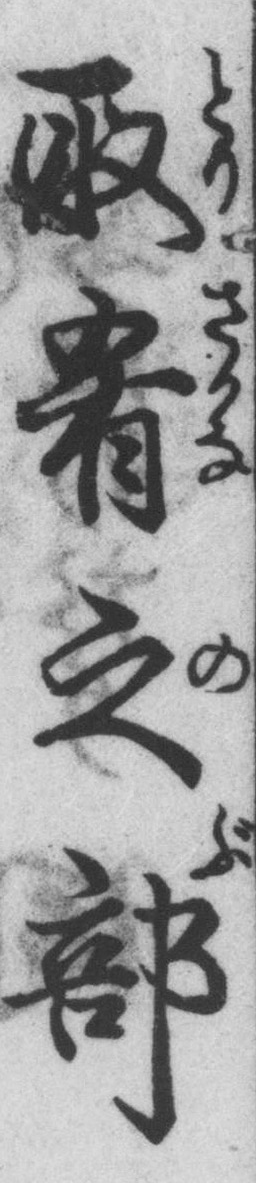取肴之部

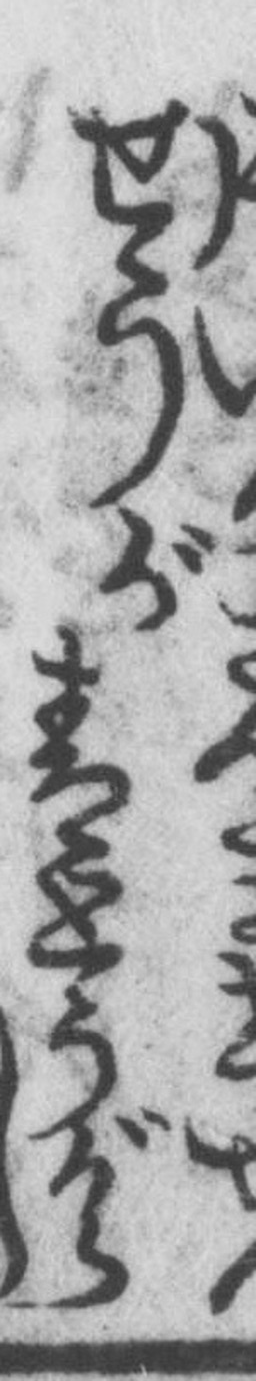せうが青とうがらし

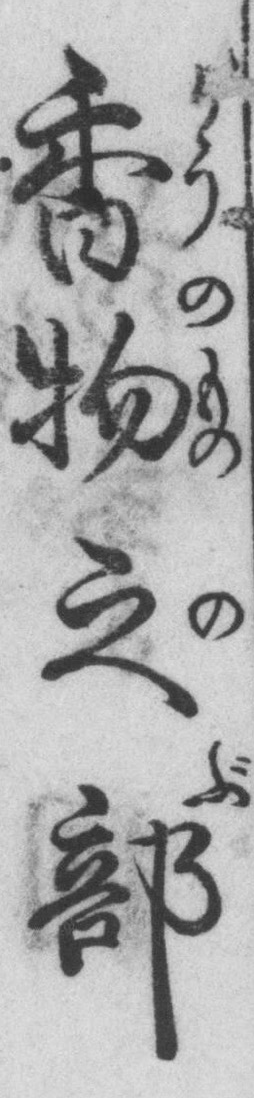香物之部
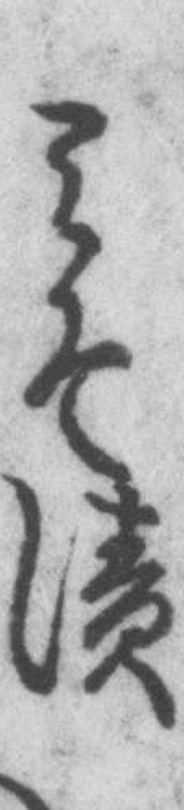しそ漬
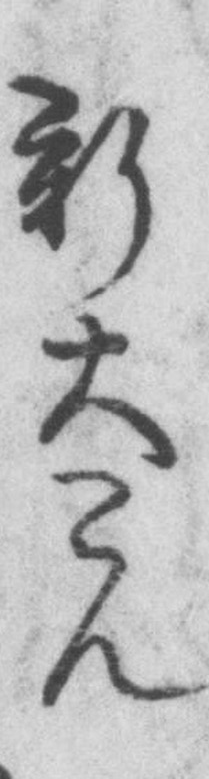同大こん
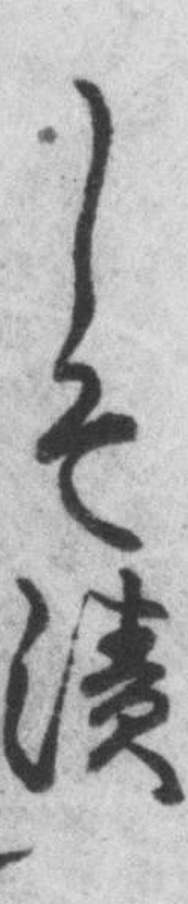しそ漬

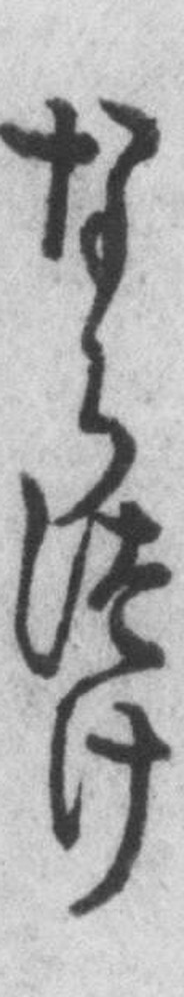なら徒け
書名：料理伊呂波庖丁
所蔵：大阪府立大学学術情報センター 国文学研究資料館
